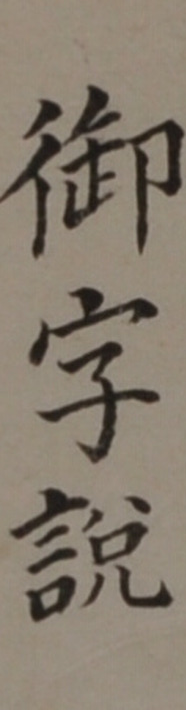御字説

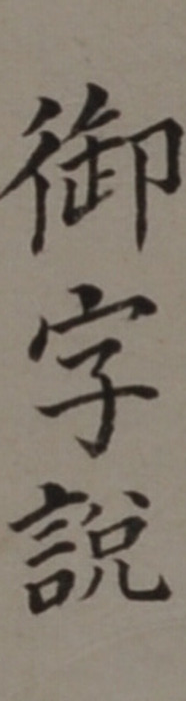御字説

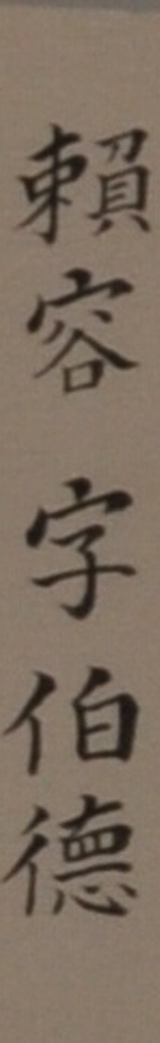頼容字伯徳
